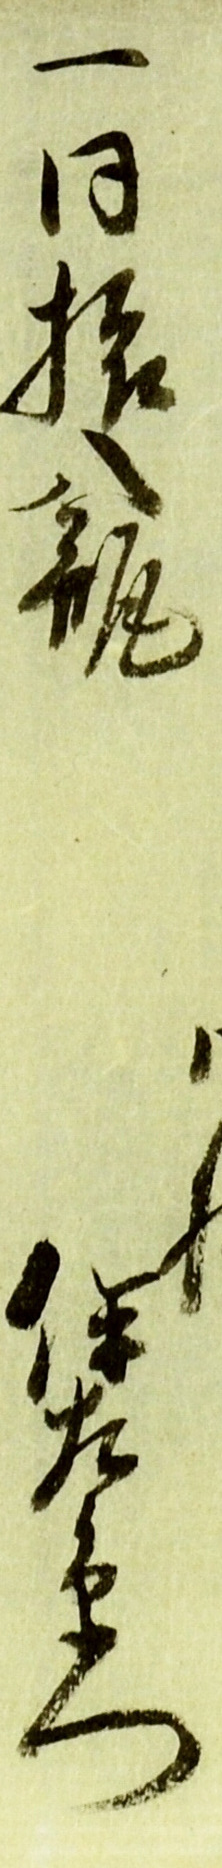一同拾八瓶伊左衛門
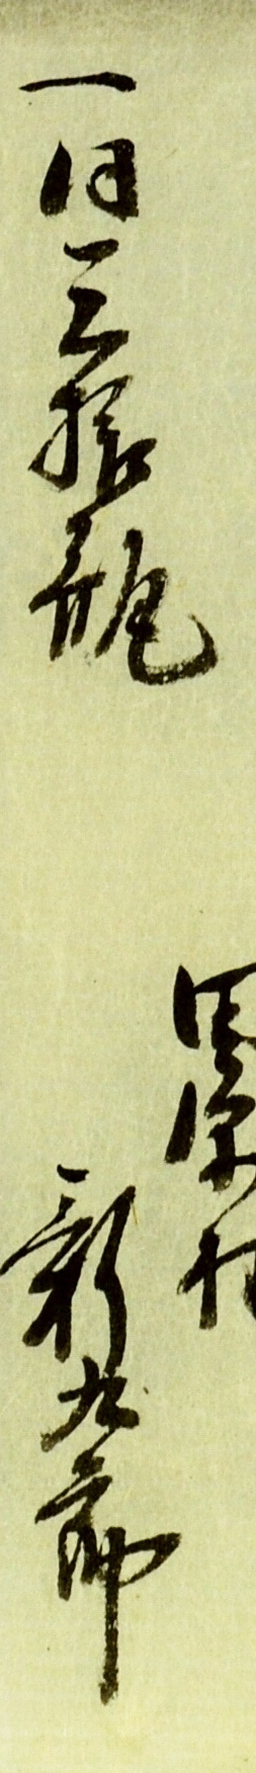一同三拾瓶新九郎
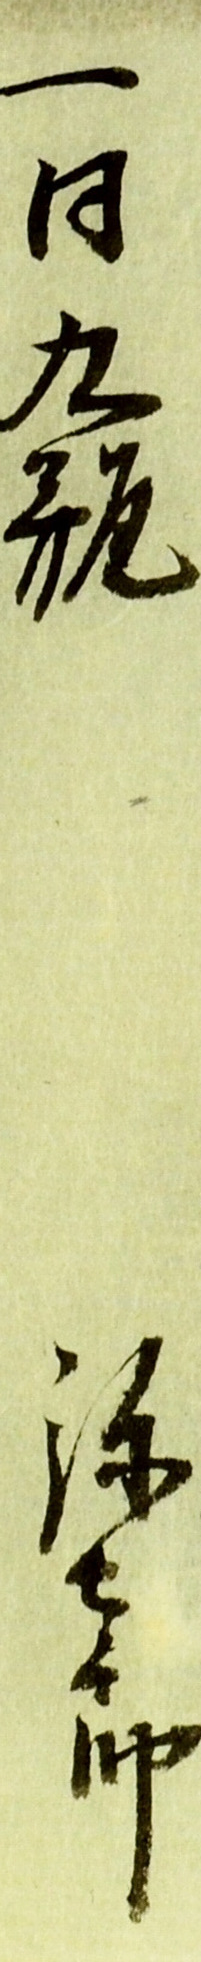一同九瓶弥七郎
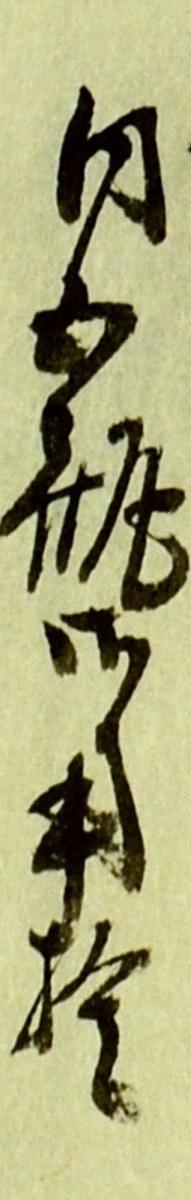内五瓶御用捨
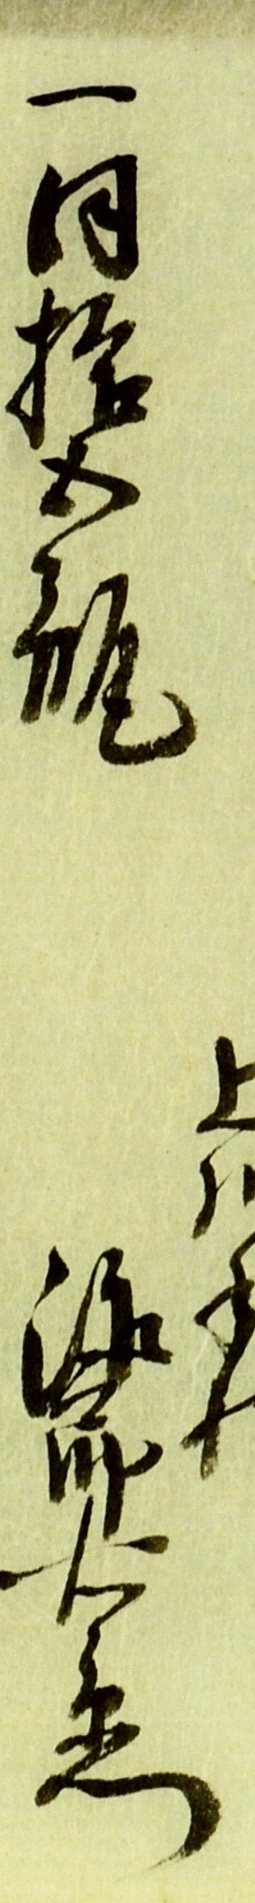一同拾五瓶治郎右衛門
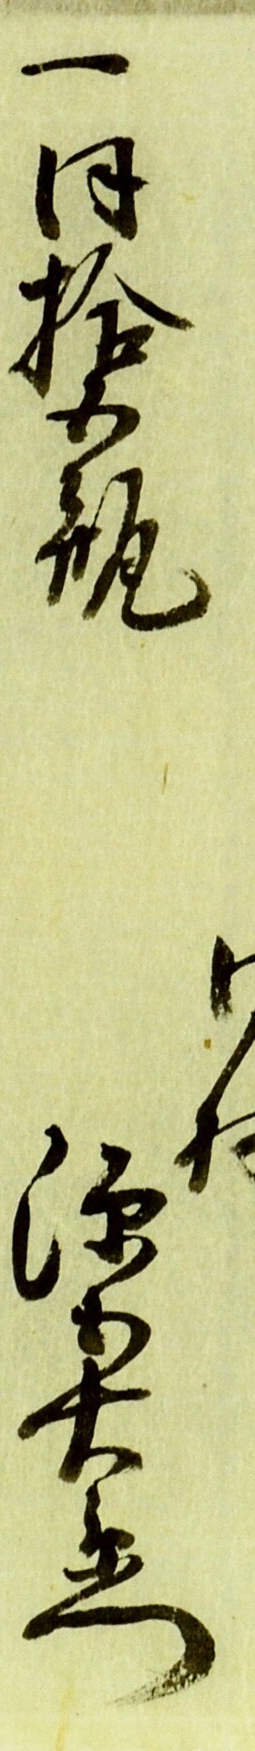一同拾五瓶源五右衛門
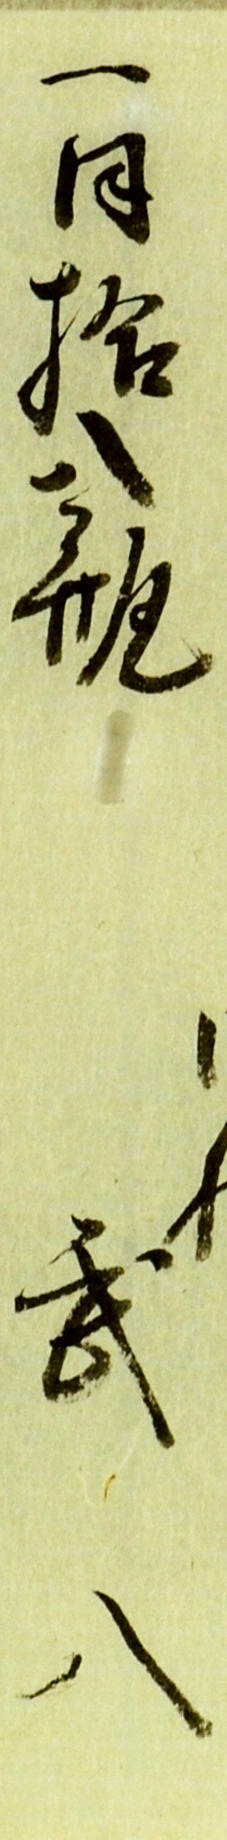一同拾八瓶武八
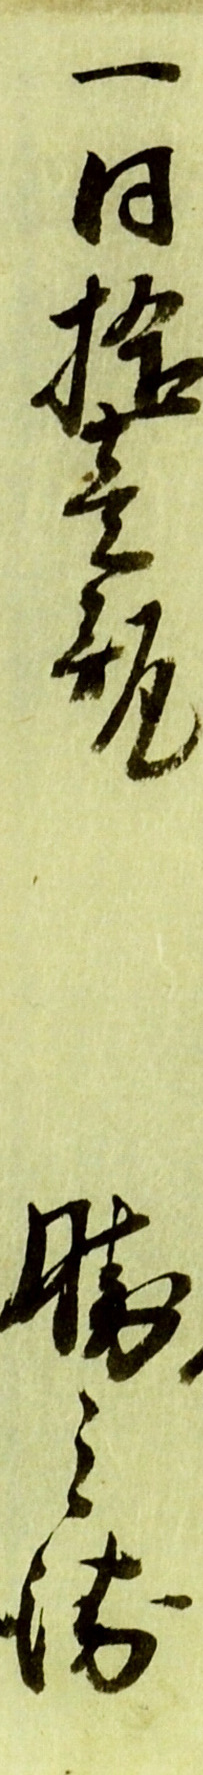一同拾壱瓶勝兵衛
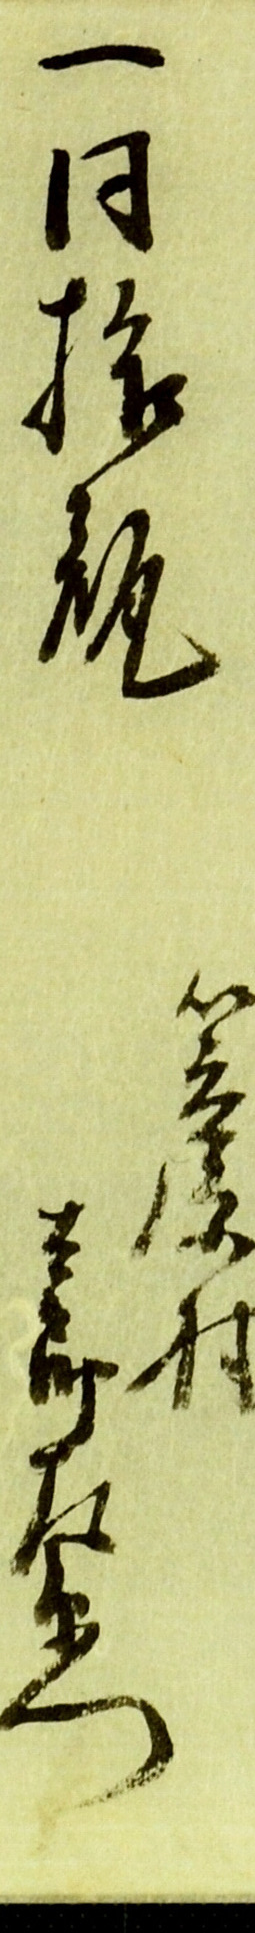一同拾瓶太郎左衛門
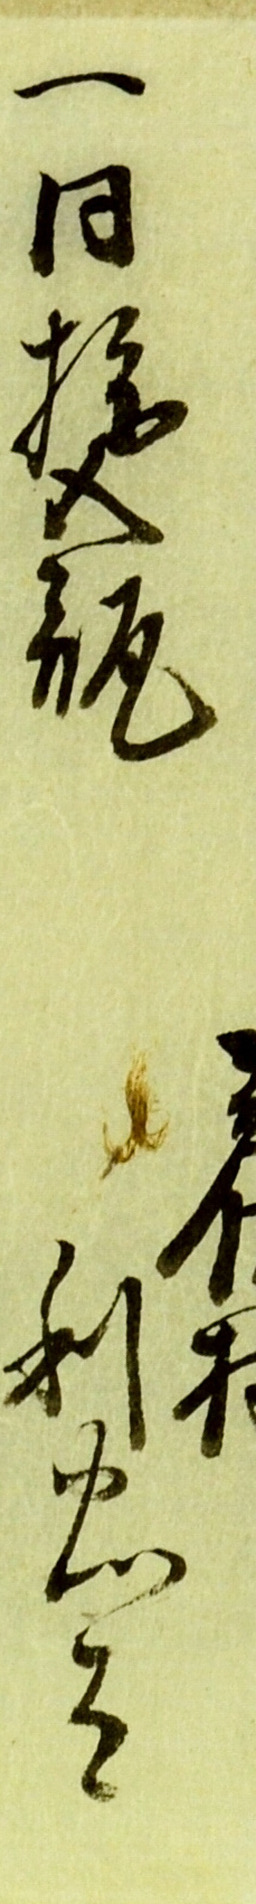一同拾五瓶利忠太
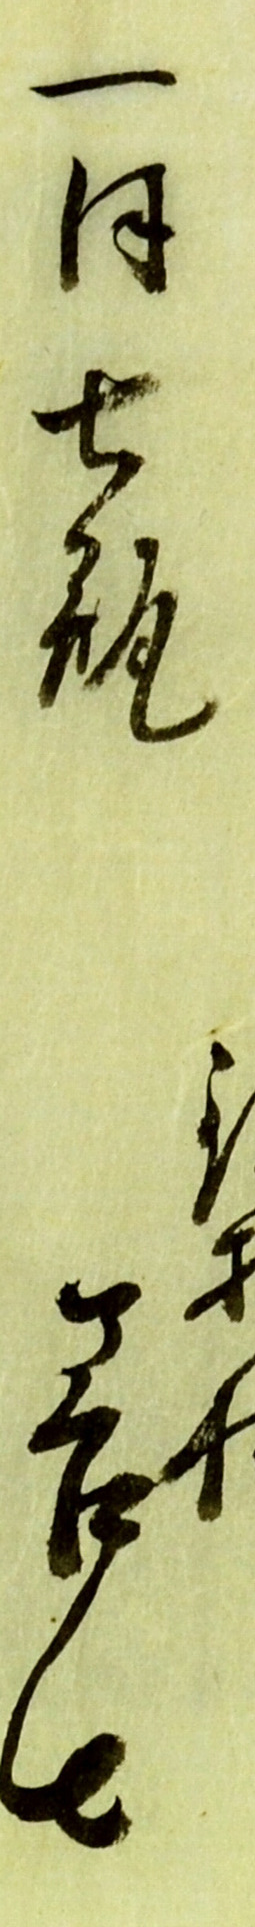一同七瓶善七

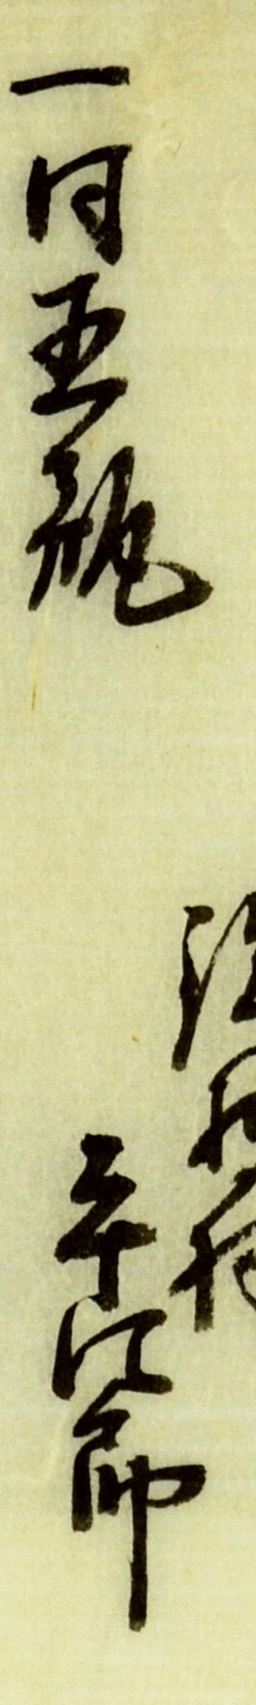一同五瓶平治郎
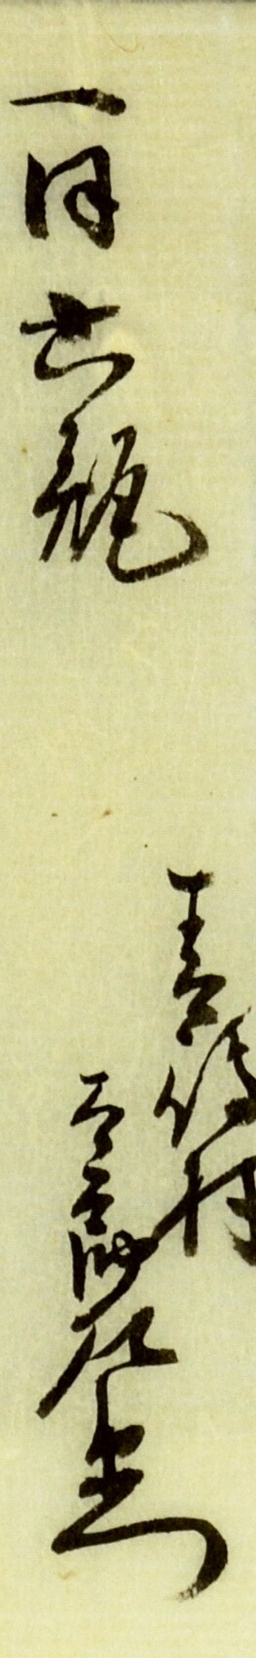一同六瓶太郎左衛門
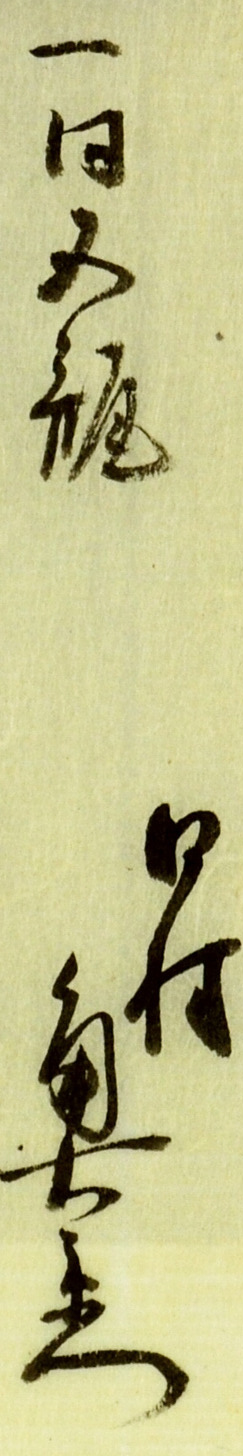一同五瓶角右衛門
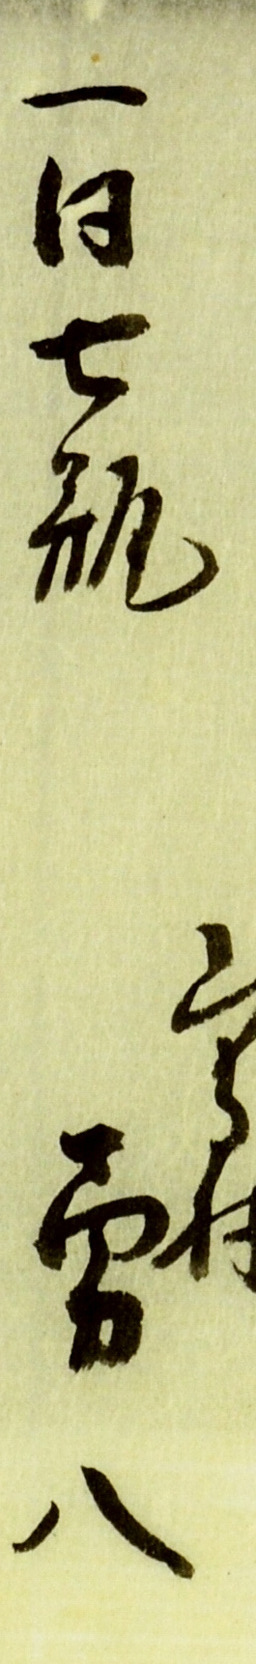一同七瓶勇八
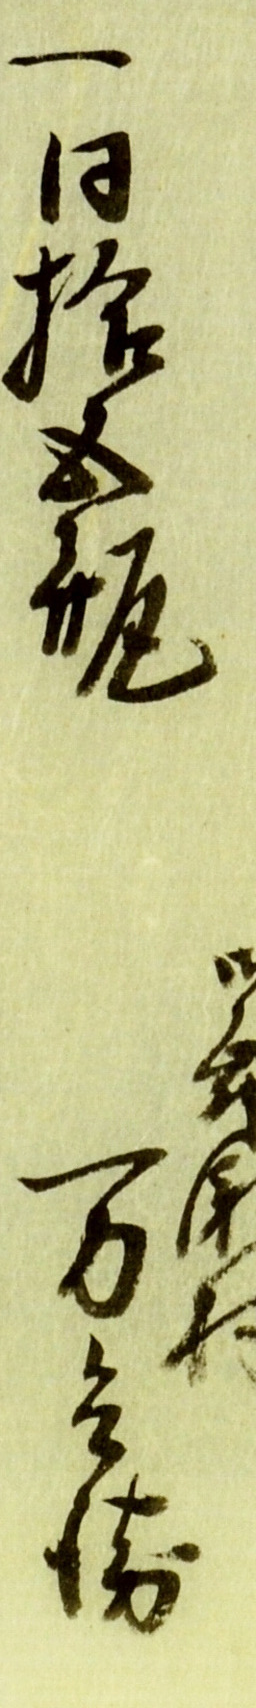一同拾五瓶万兵衛
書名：御領分中御領分中紺屋藍瓶員数御改帳
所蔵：伊那市立高遠町図書館・合同会社AMANE
